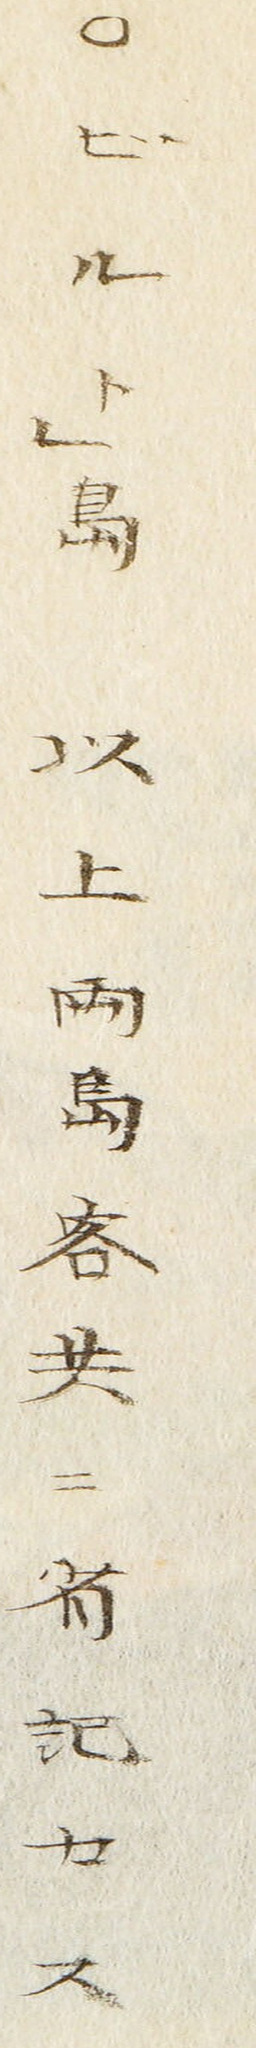〇ビルト」島以上両島客共ニ省記セス

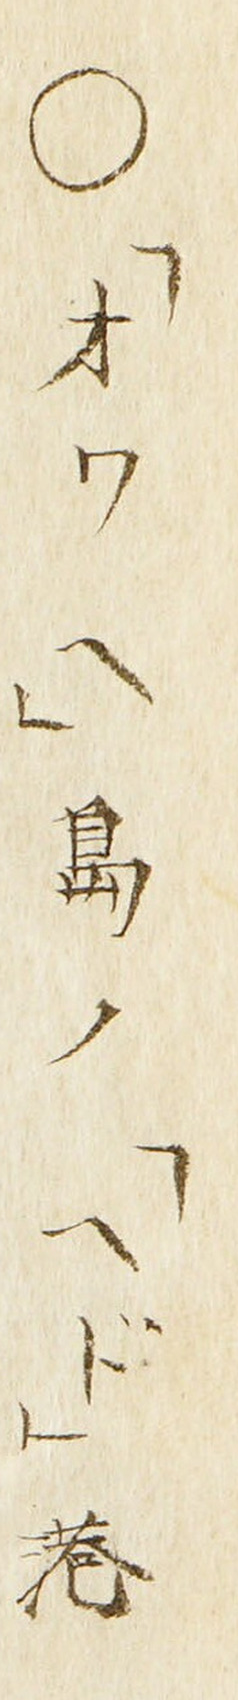〇「オワヘ」島ノ「ヘド」港
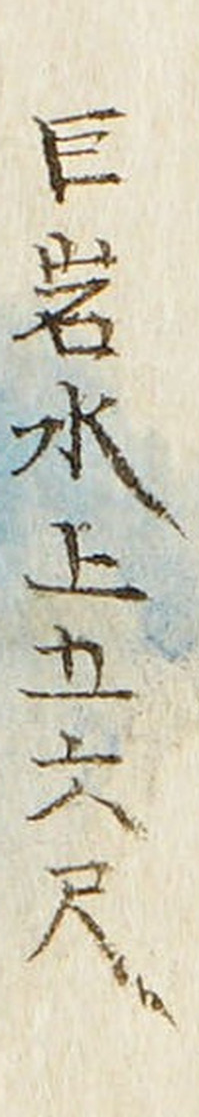巨岩水上五六尺
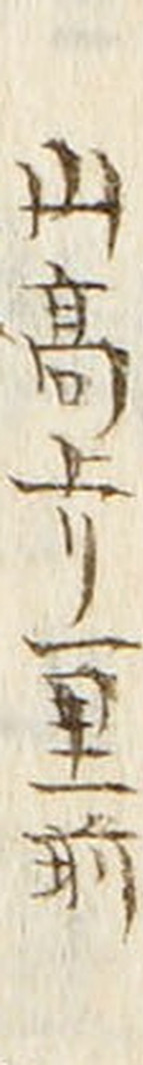山高上リ一里前

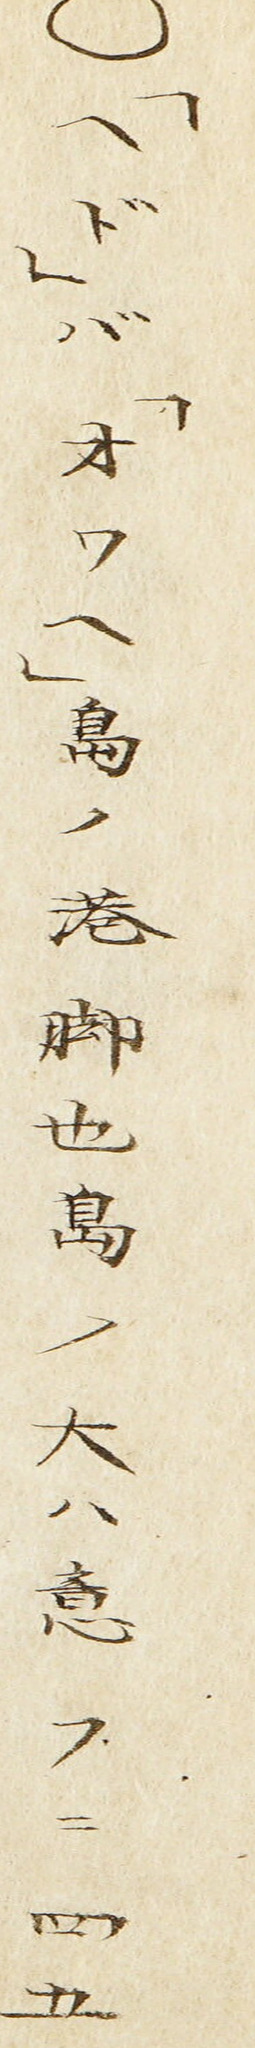〇『ヘド」バ「オワヘ」島ノ港脚也島ノ大ハ意フニ四五
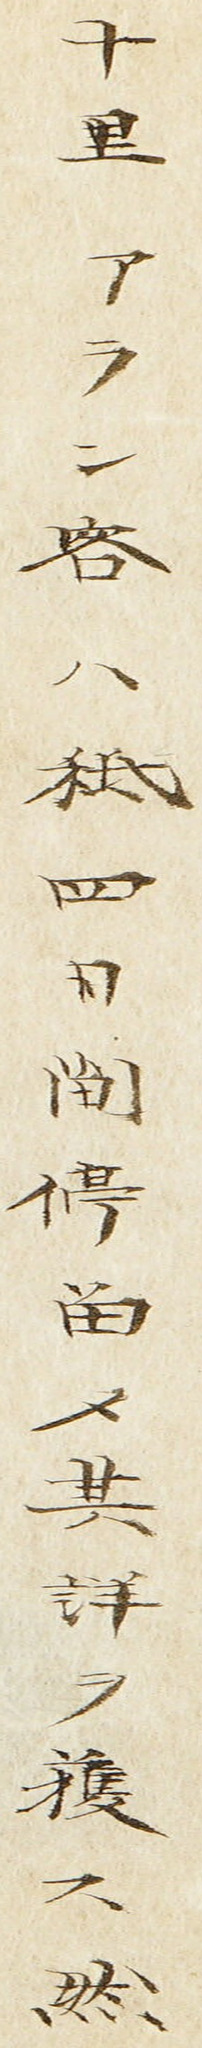十里アラン客ハ秪四日間停留シテ其詳ヲ穫ス然
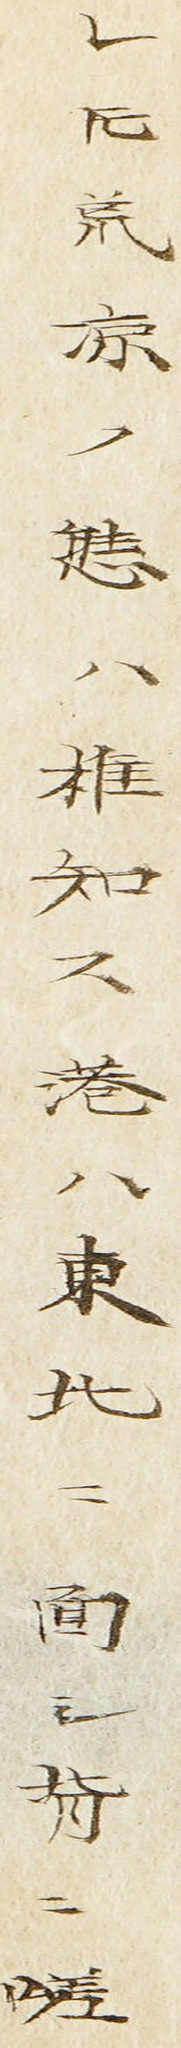レトモ荒涼ノ態ハ椎知ス港ハ東北二ニ面シ背ニ嗟
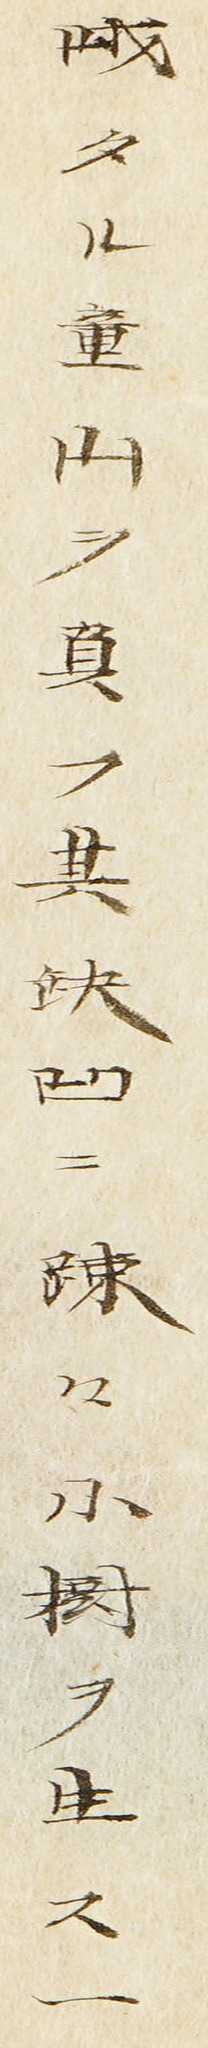※哦タル重山ヲ負フ其缺凹ニ疎々小樹ヲ生ス一
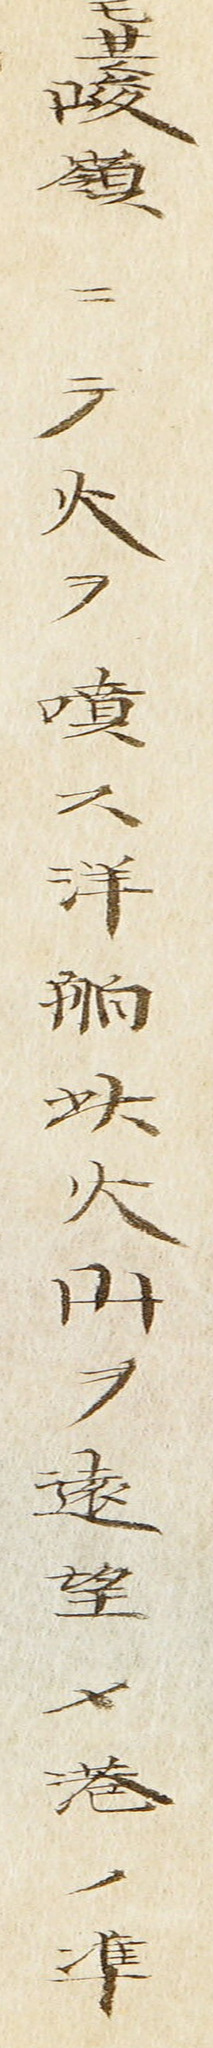陖嶺ニテ火ヲ噴ス洋舶此火山ヲ遠望シテ港ノ準
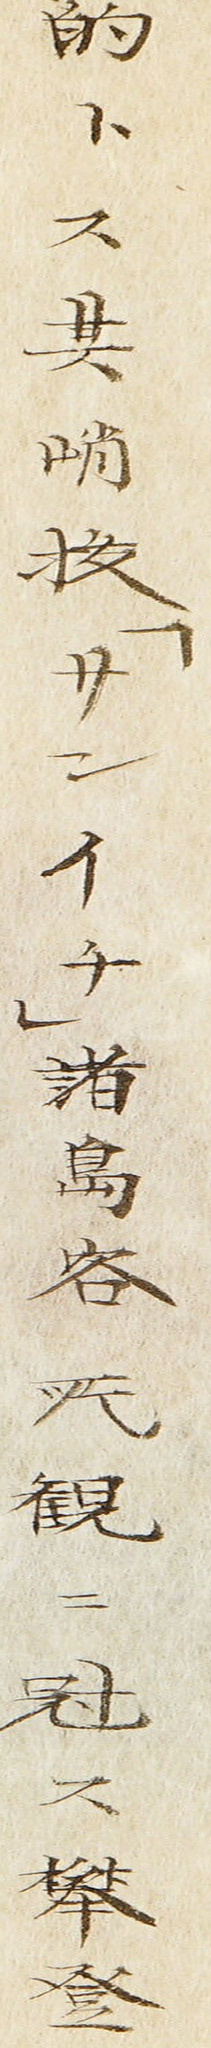的トス其哨校？「サンイチ」諸島客所？観ニ冠ス攀登
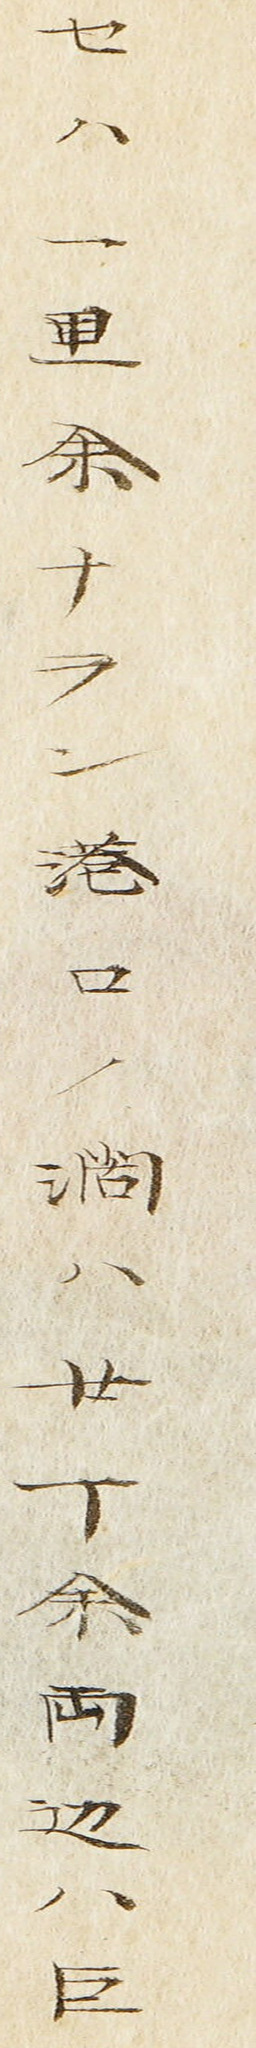セハ一里余ナラン港口ノ濶ハ廿丁余両辺ハ巨
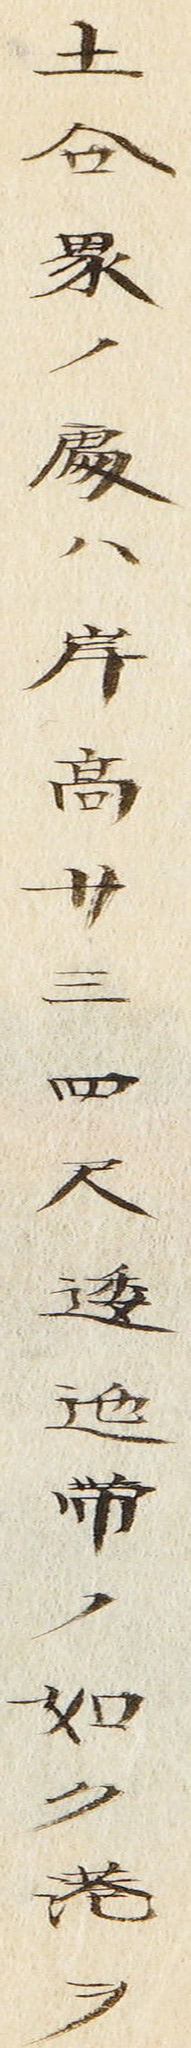土合ノ處ハ岸高サ三四尺逶迆帯ノ如ク港ヲ
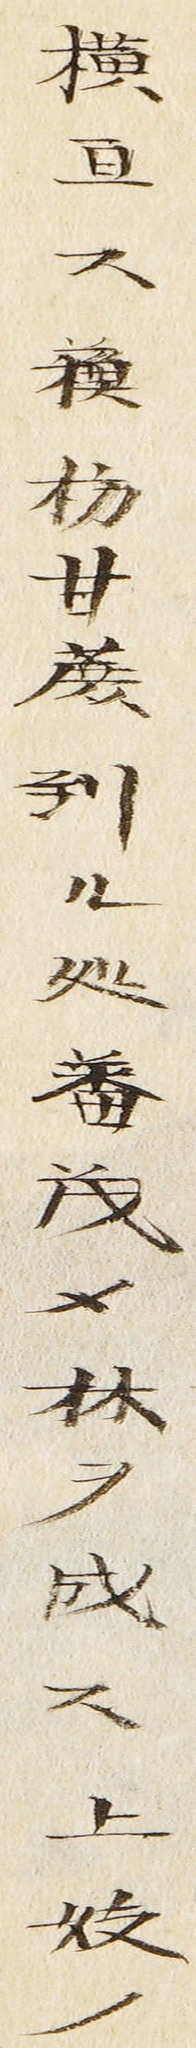横亘ス蘓枋甘蔗到ル所蕃茂シテ林ヲ成ス上妓ノ
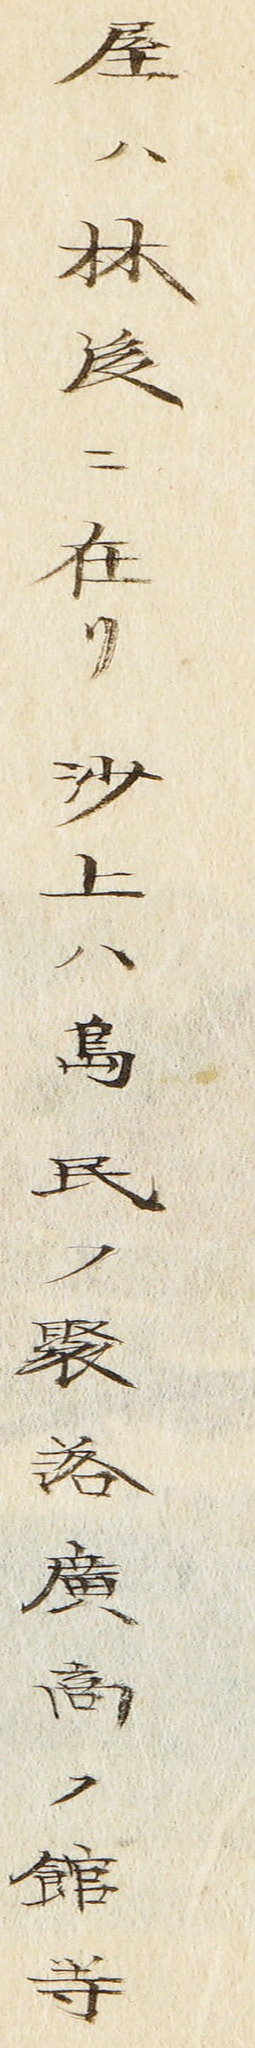屋ハ林後ニ在リ沙上ハ島民樷ノ聚落廣商ノ館等
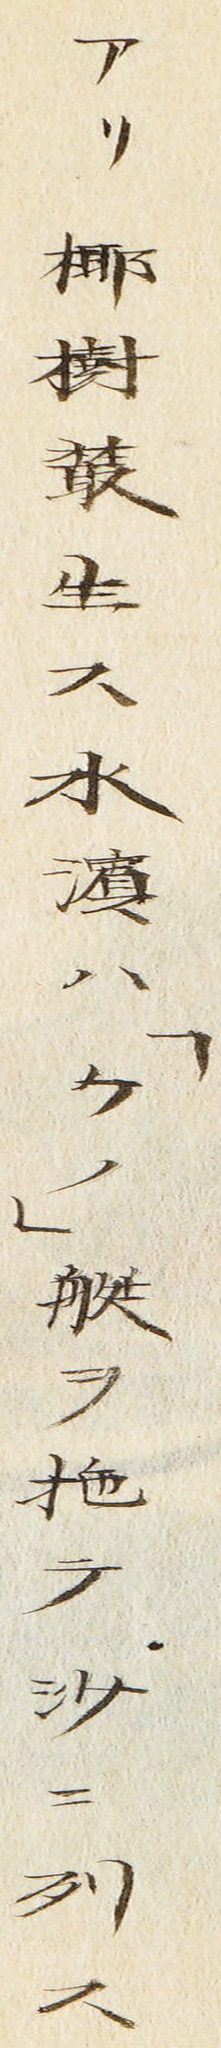アリ椰樹樷生ス水濱ハ「ケノ」艇ヲ柂テ沙ニ列ス
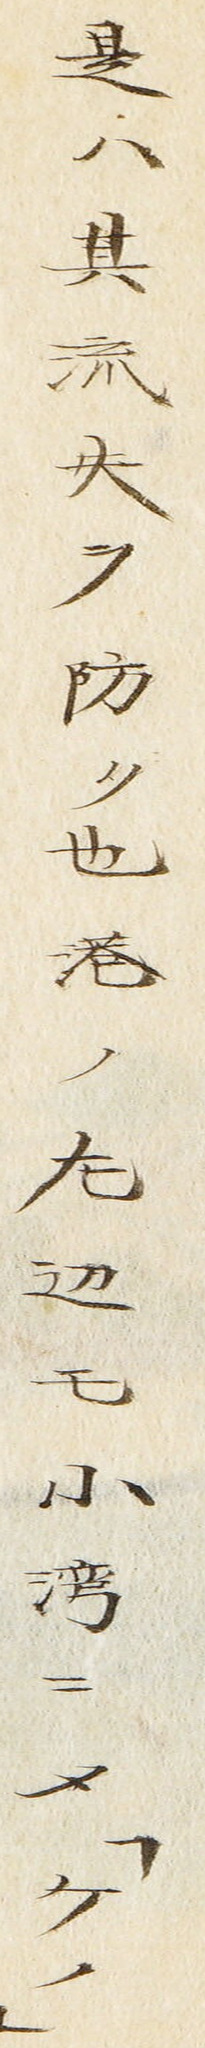是ハ其流失ヲ防ク也港ノ左辺モ小湾ニシテ「ケノ」
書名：蕃談
